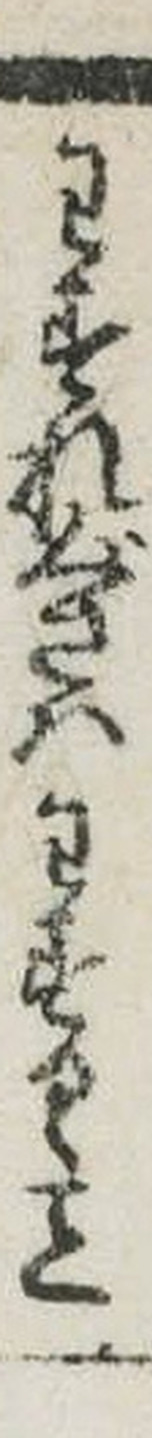わすれぐさはわするゝこと
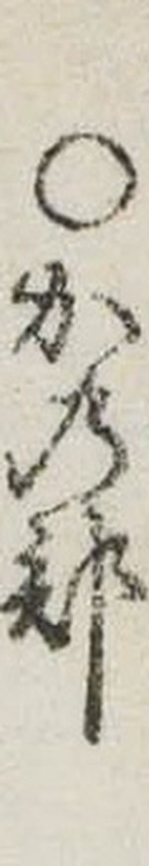○かの部
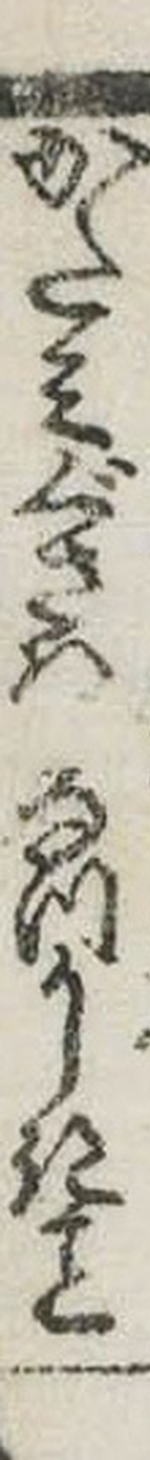かたみぐさはなつかしきこと
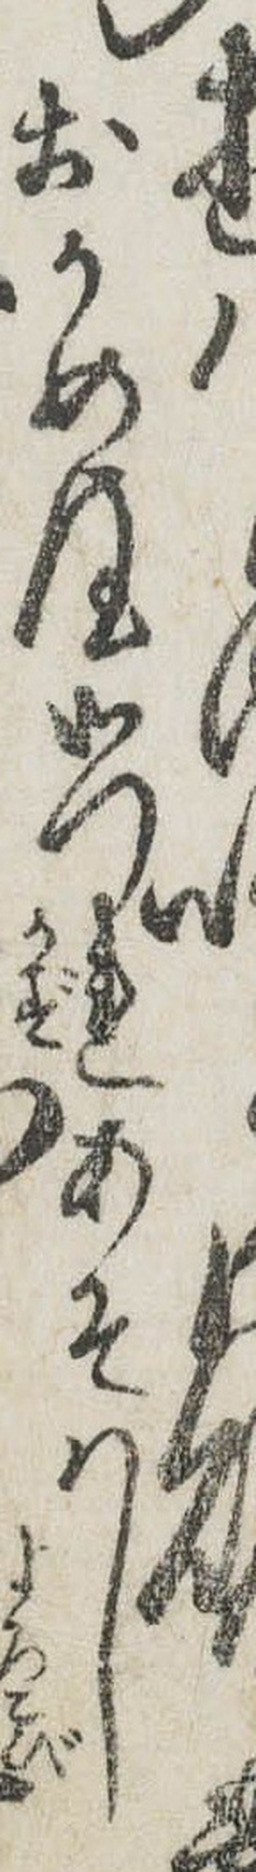おかめさま御つれあそはし
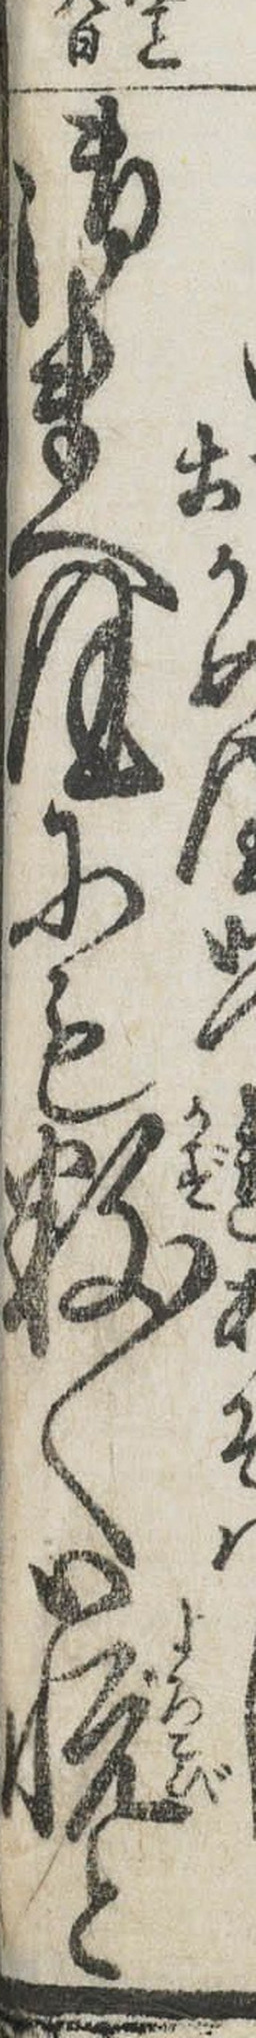御まへさまにも数〳〵御悦と
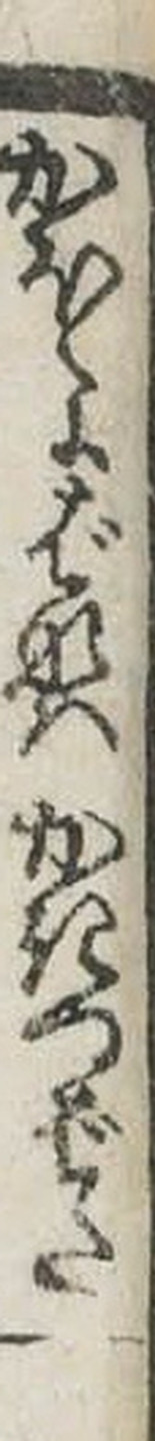かほよばなはかきつばた
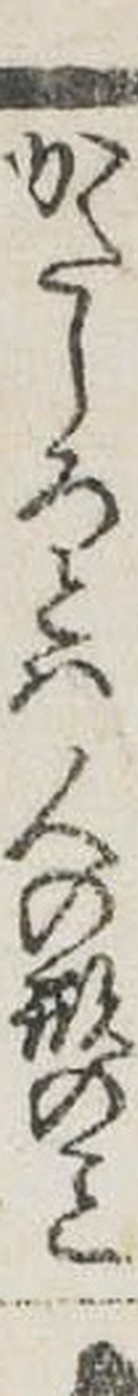かたしろとは人の形のこと
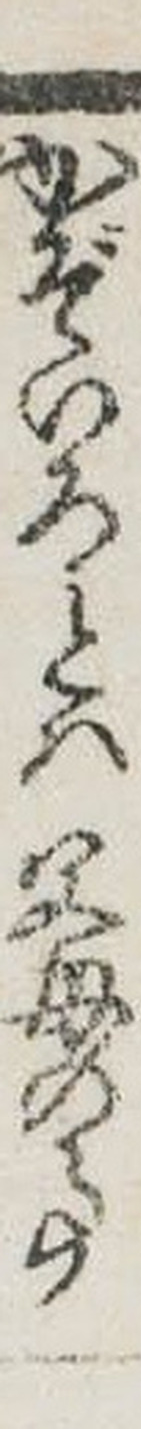かぞいろとは父母の事
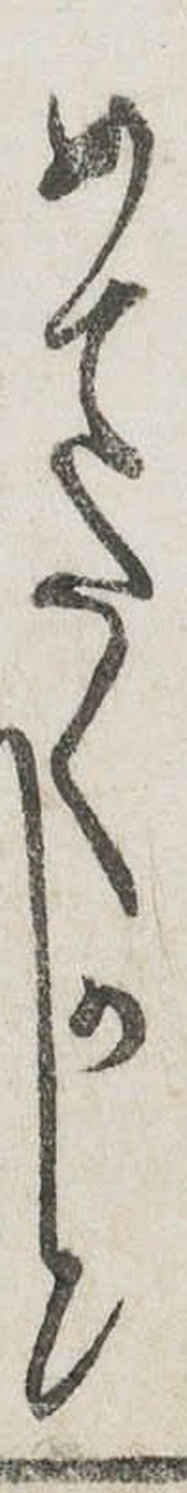めてたくかしく
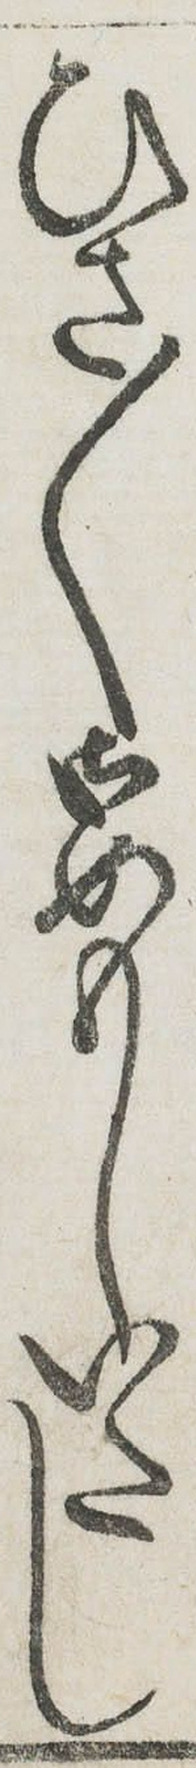ひさ〳〵御めもしいたし
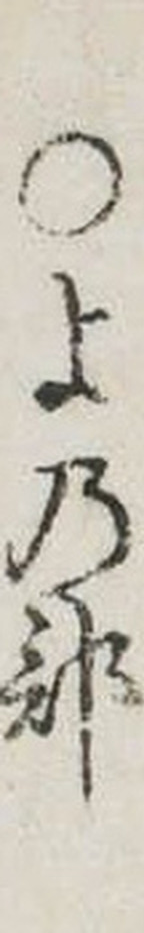○よの部
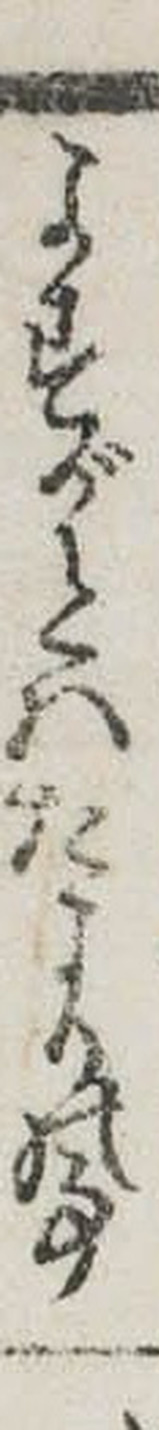よすがとはたよりの事
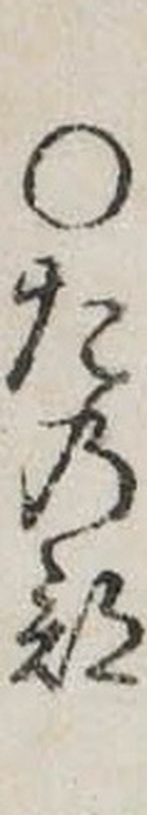○たの部
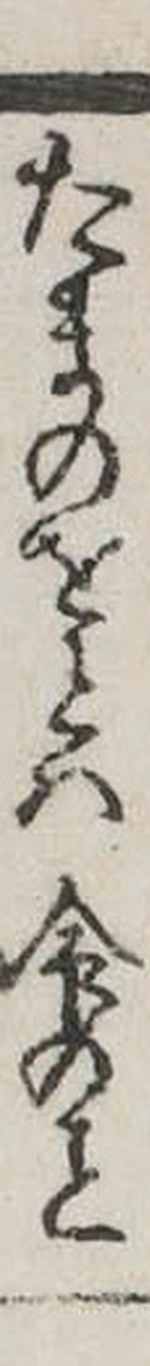たまのをとは命のこと
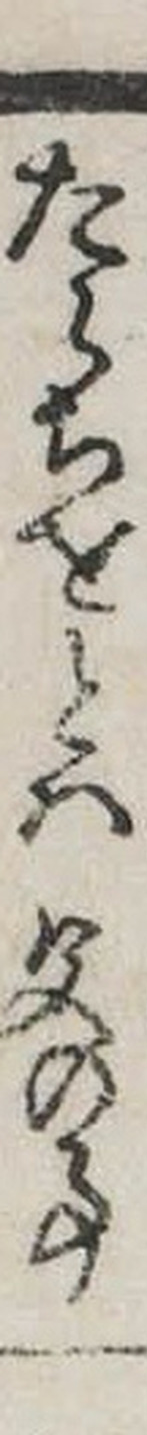たらちをとは父の事
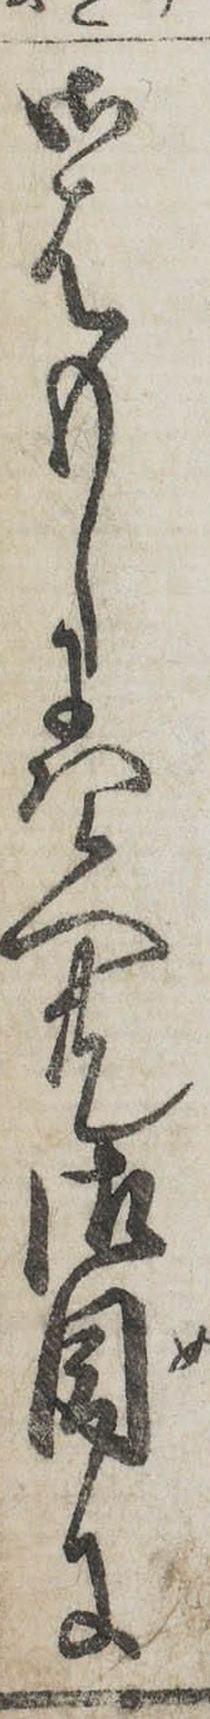御はもしには候へ共御目に
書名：頭書萬用婦人手紙之文言
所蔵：東京学芸大学教育コンテンツアーカイブ
